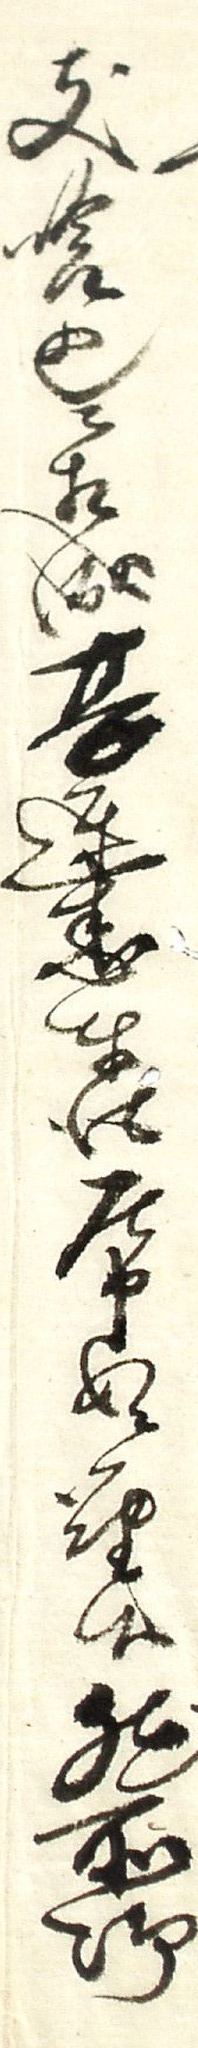支喰込ニ相成甚迷惑奉仕居申義ニ御座候然所御
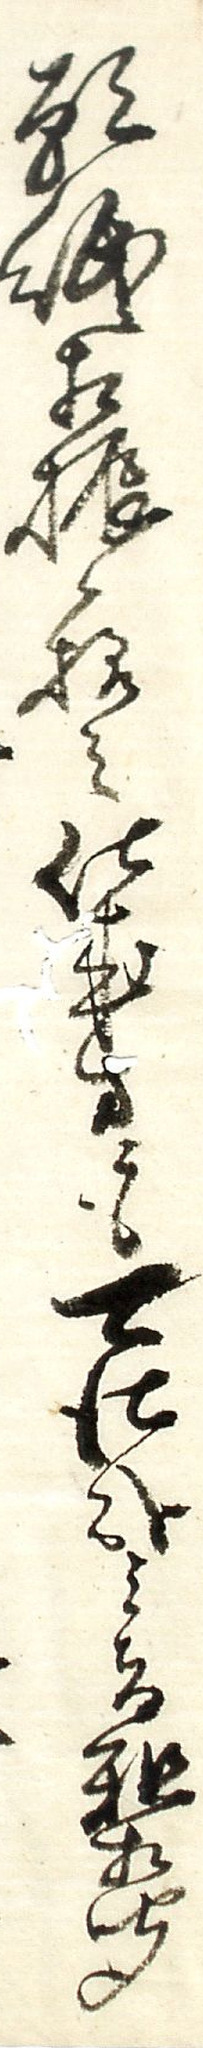願紙相振候様之仕成ニも可仕哉之旨粗相聞
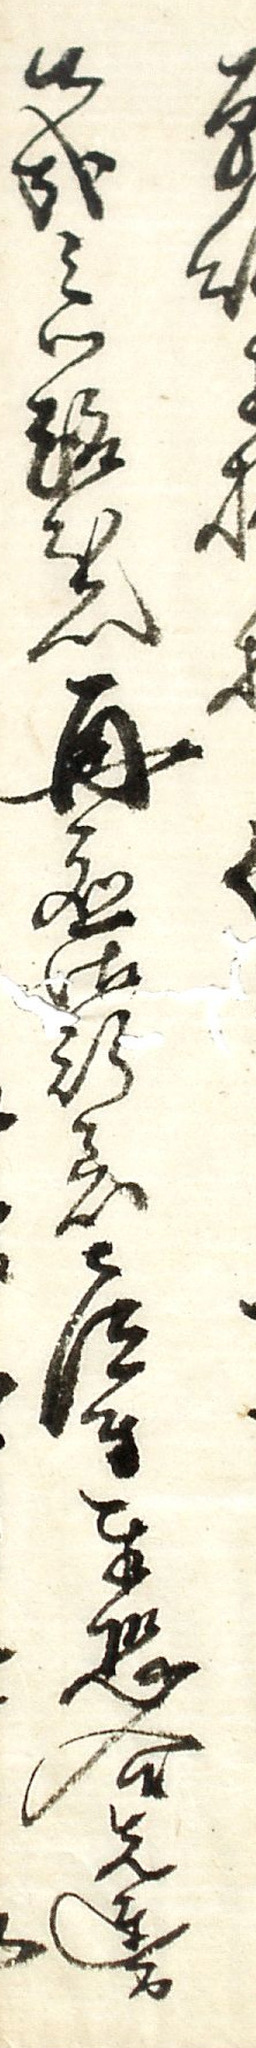候哉之御趣を以再應御行着被仰付奉恐入候先達而
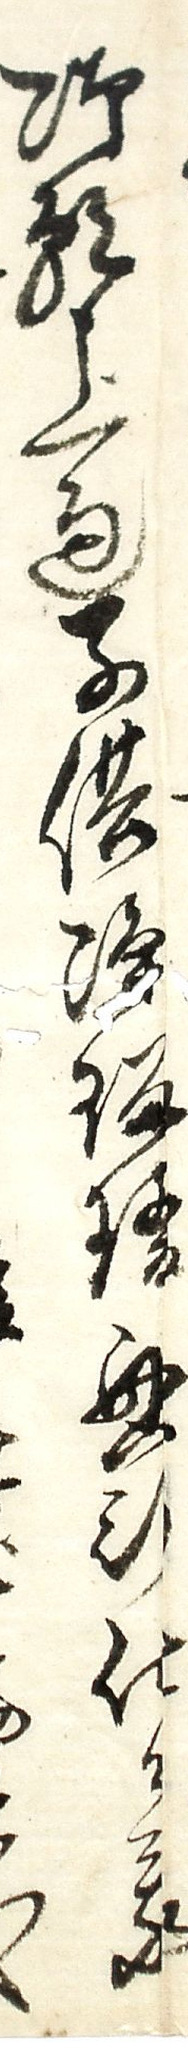御願申上通子供浄瑠璃興行仕候義
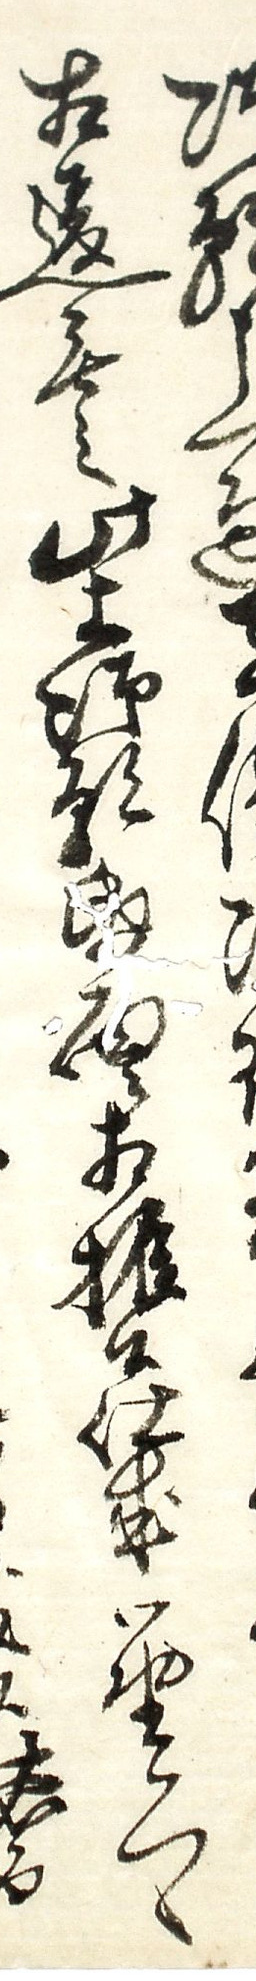相違無之此上御願帋面ニ相振候仕成御座候ハヽ
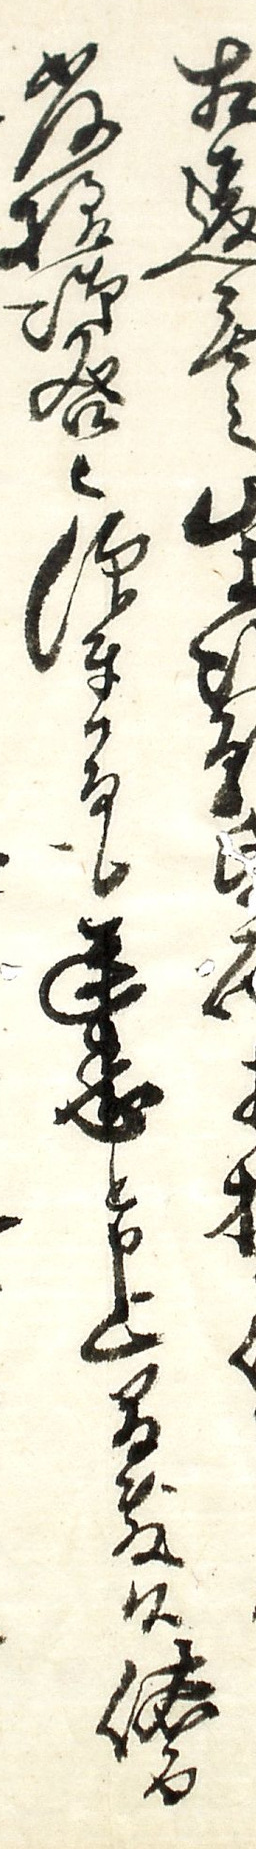如何様御咎被仰付候而も迷惑と申上間敷候依而
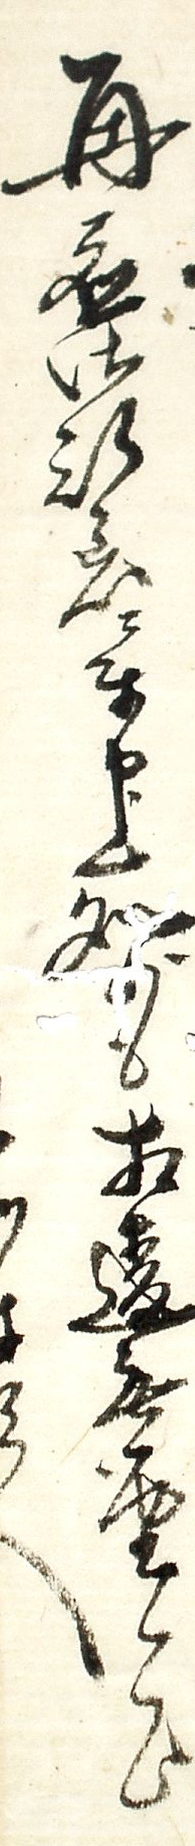再應御行着ニ付申上処少も相違無御座候以上
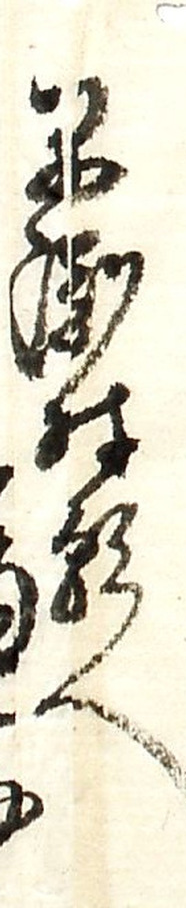早渕村願人
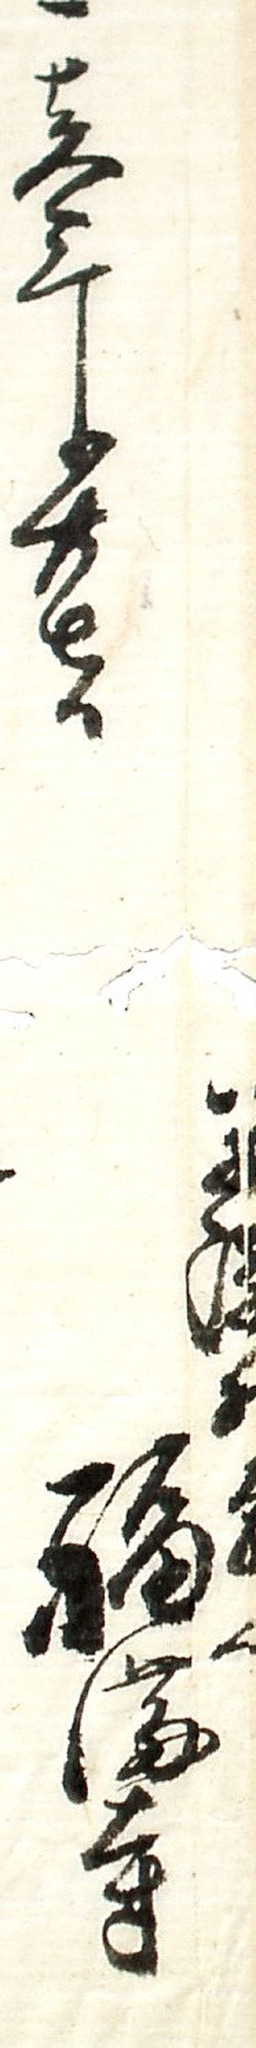亥三月廿七日福満寺
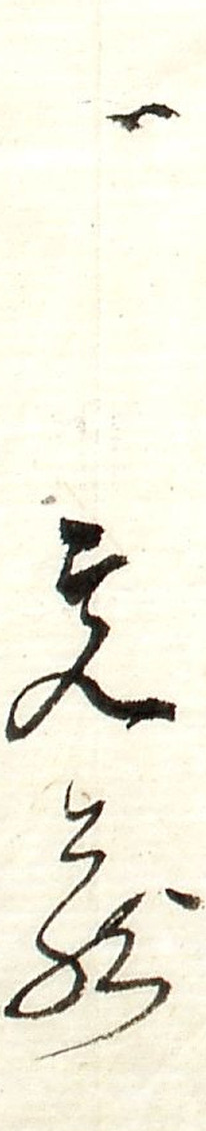同文蔵
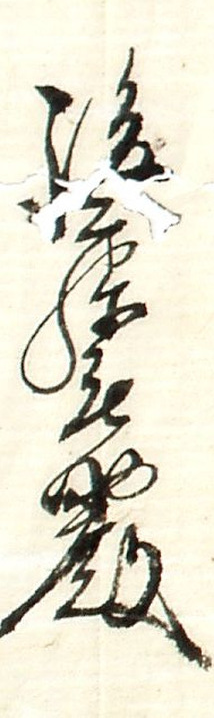後藤庄助殿
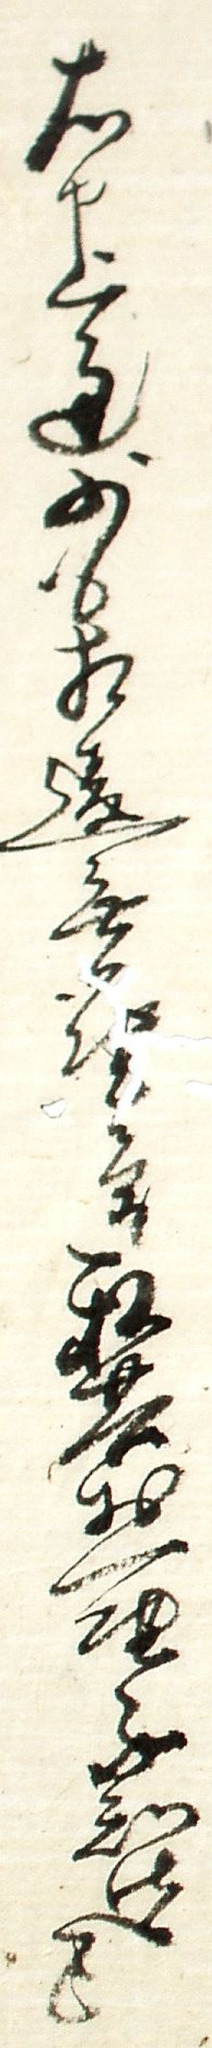右申上通少も相違無御座候ニ付私共於一座承知仕候以上
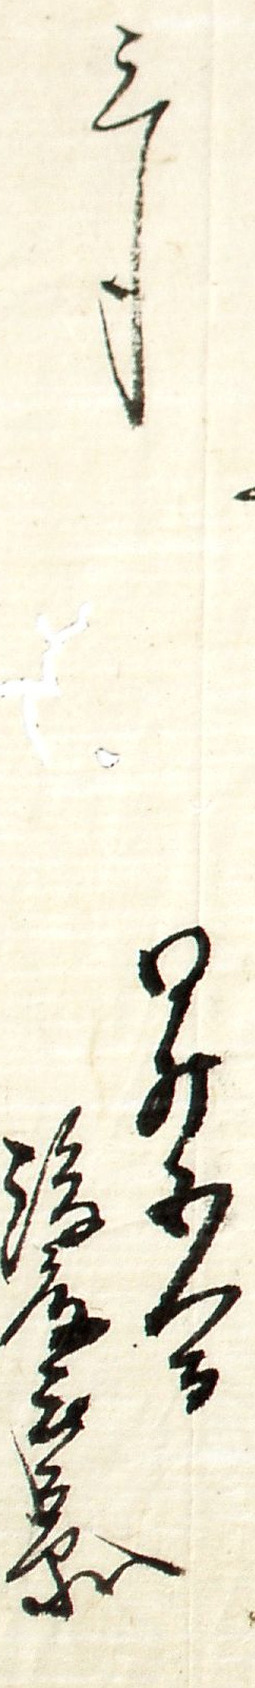三月同村五人与
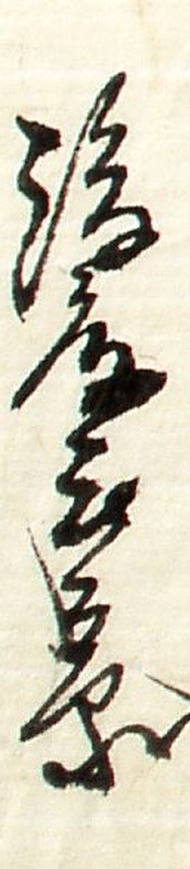後藤庄兵衛

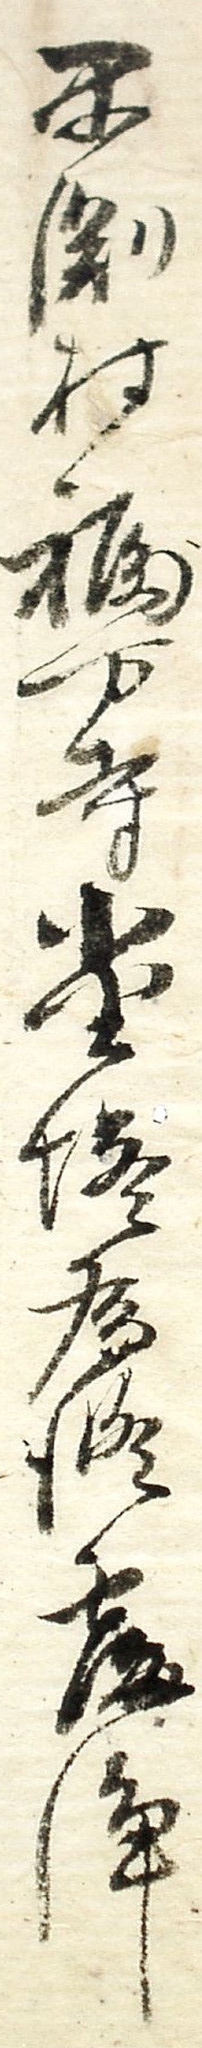早渕村福万寺堂塔為修覆浄
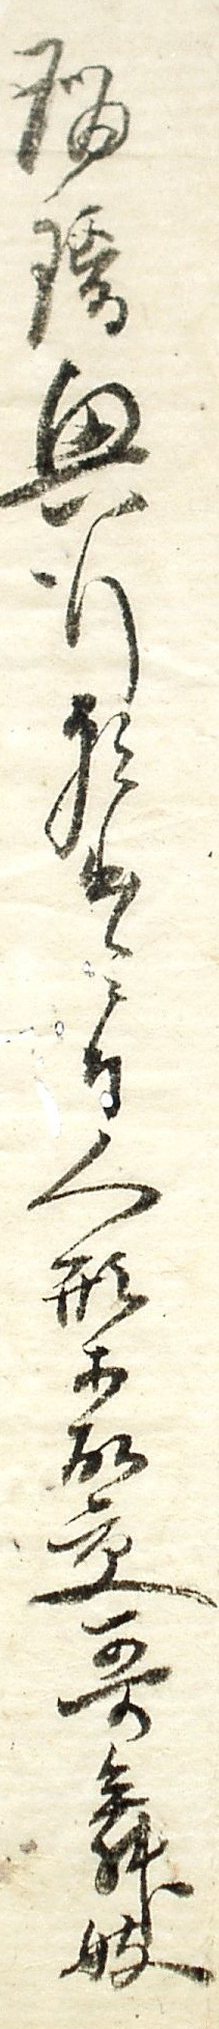瑠璃興行願出候ニ付人形等取交哥舞妓
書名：早渕村福満寺浄瑠璃再応行着添書ひかへ
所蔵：鳴門教育大学 Naruto University of Education
